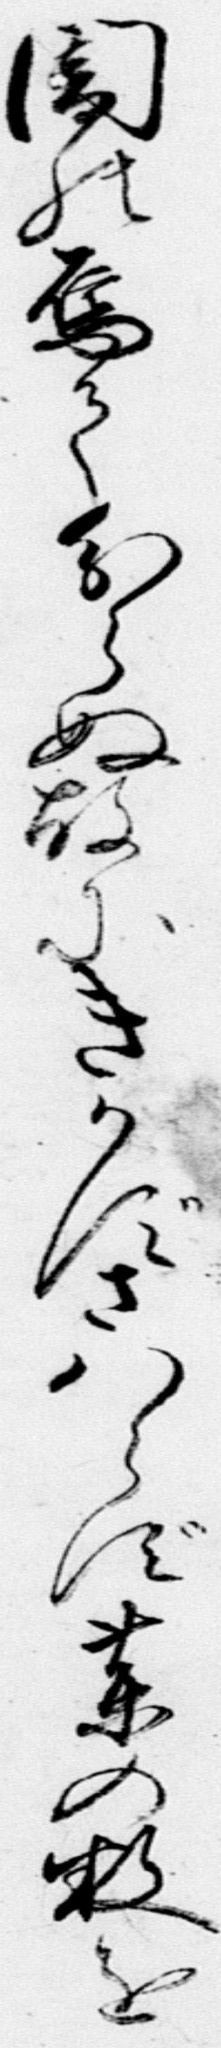闇の烏て分らぬ故にきかずさはらず薬の数を
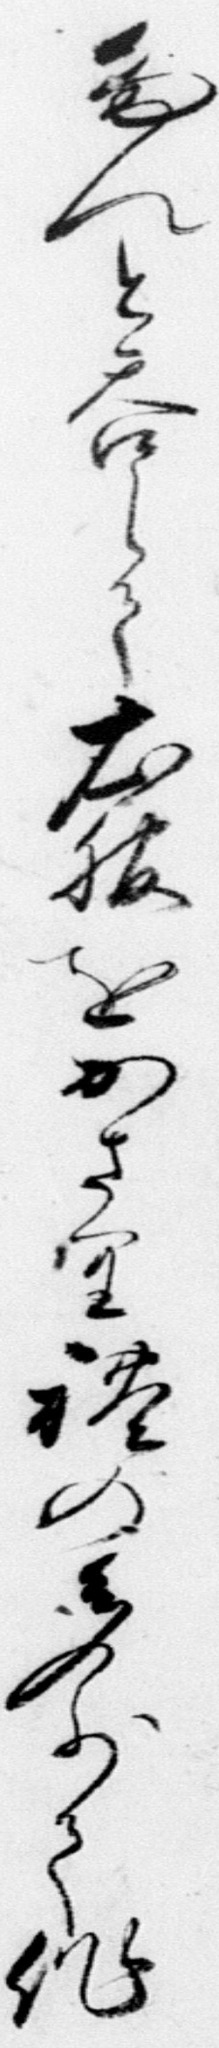たんと呑して衣服をかさり礼の多少て作
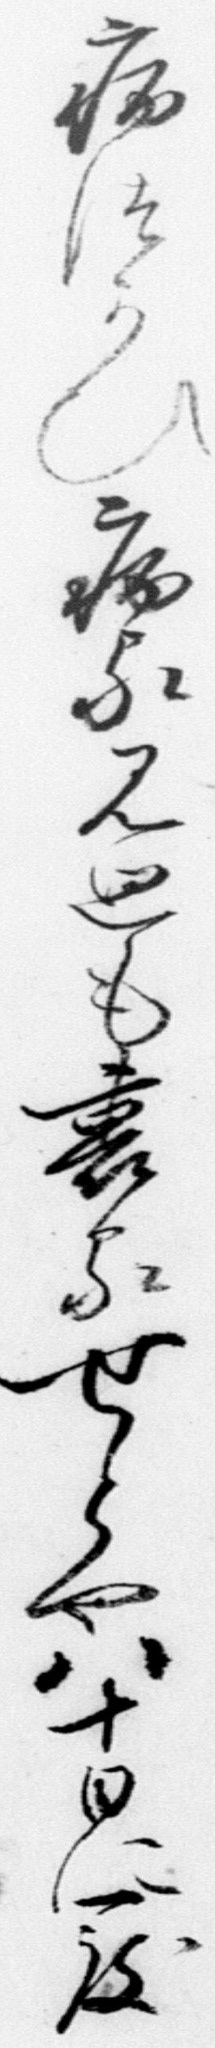病つかひ病家見廻も裏家せとや八十日に一度
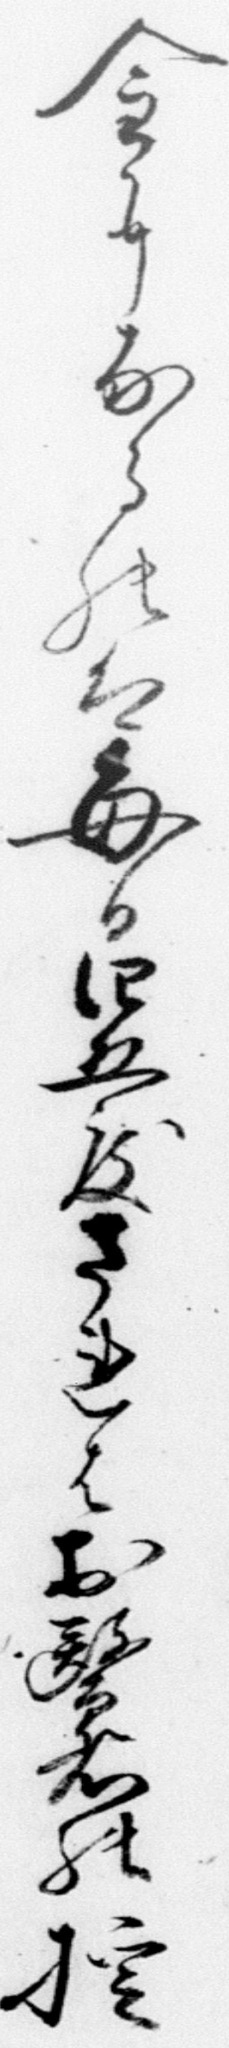金になるのは毎日四五度されはお医者の掟
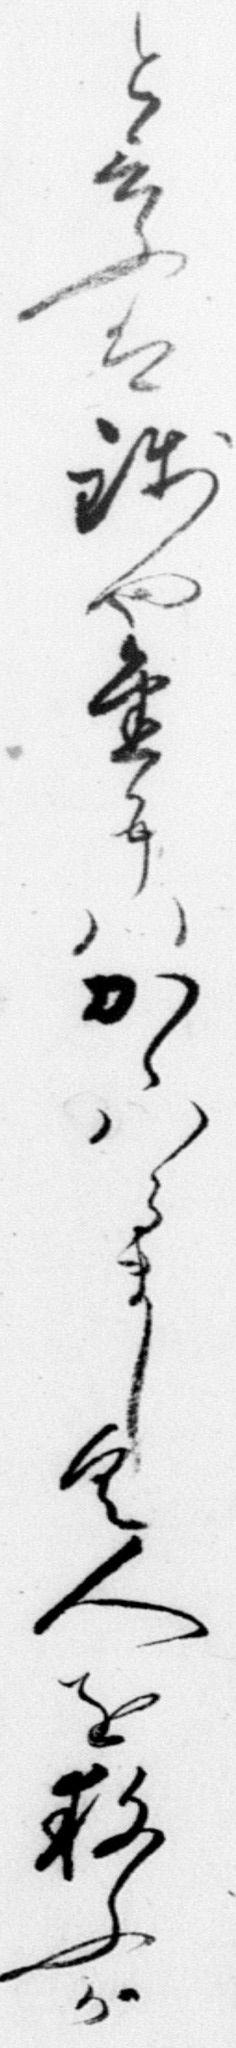と言ふは銭や金にはかゝはるましく人を救ふが
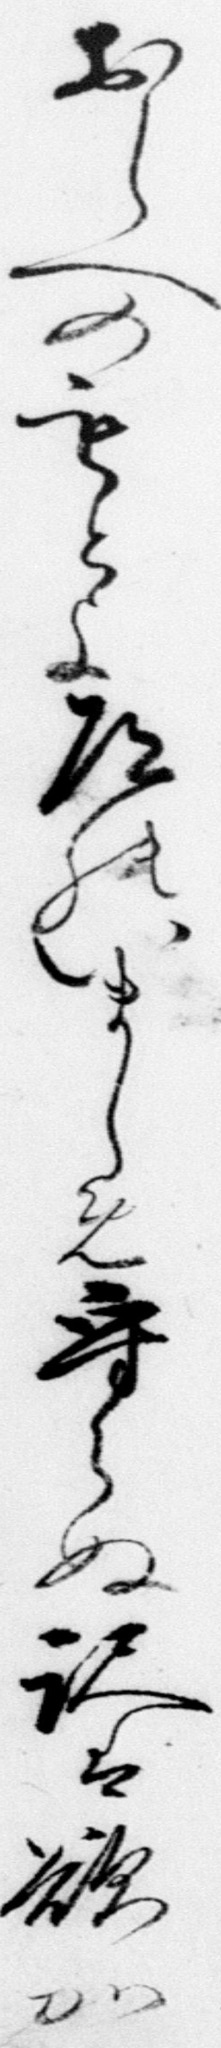おしへのもとよ道のいましめ守らぬ訳は欲か
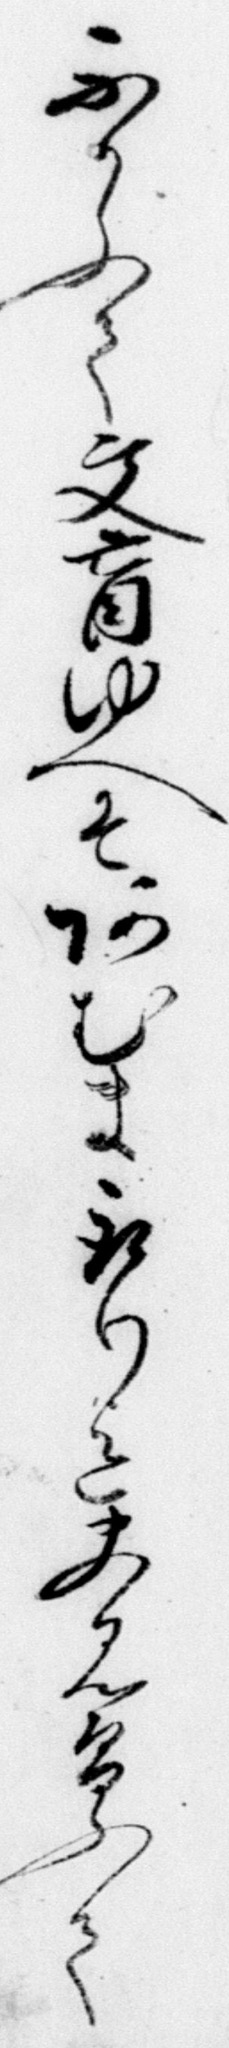ふかふて文盲ゆへそあむま取り迄夫見習ふて
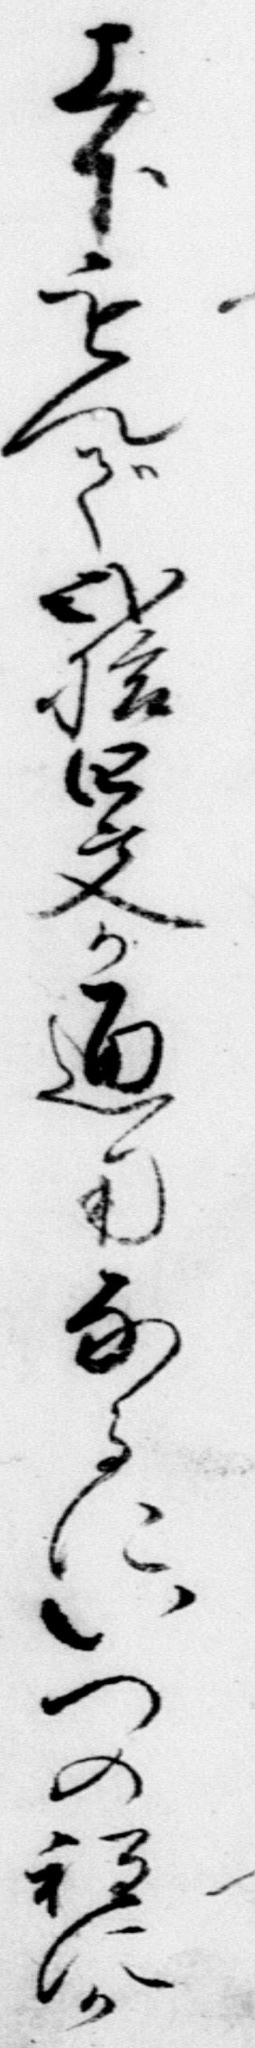上下もんで弐拾四文か通用なるにいつの程にか

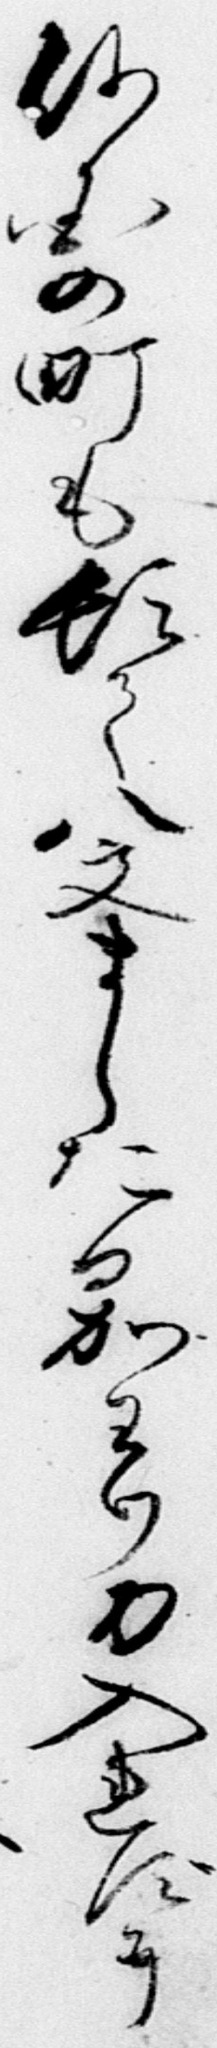何国の町も頓て八文ましたるかわり力入れずに
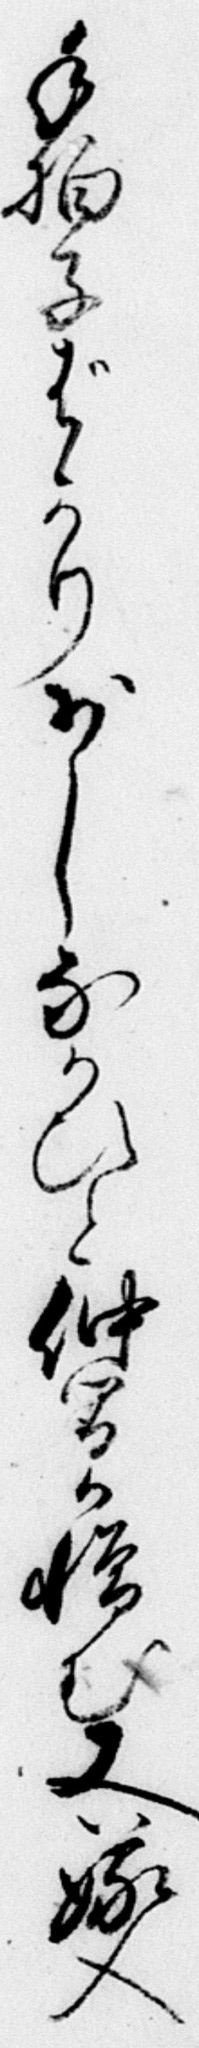手拍子ばかり少しなかひと仲間か憎む又は嫁入
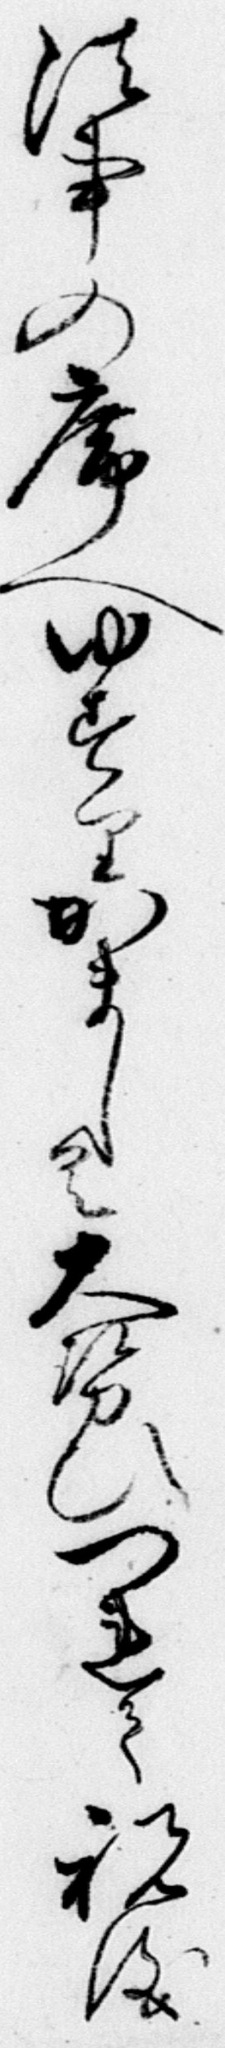法事の席へゆすりかましく大勢ひつれて祝儀
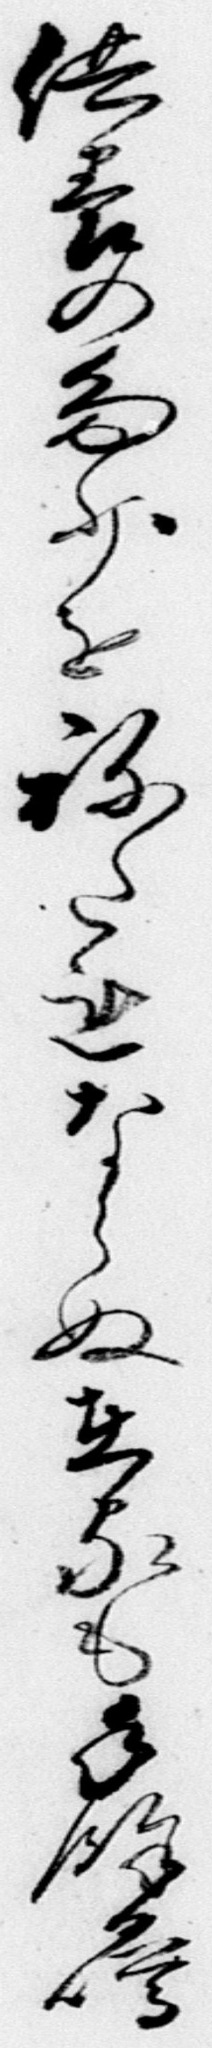供養の多少をねたれならぬ在家も手余る噂
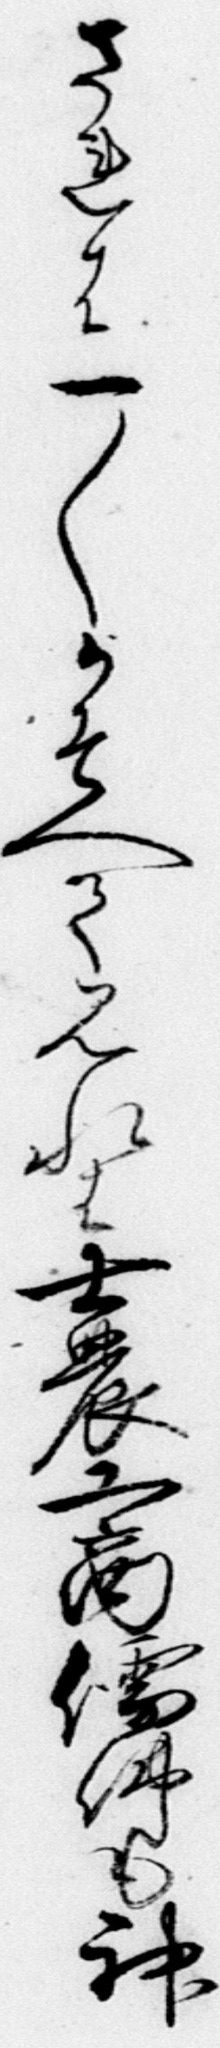されは一々かそへて見れは士農工商儒仏も神
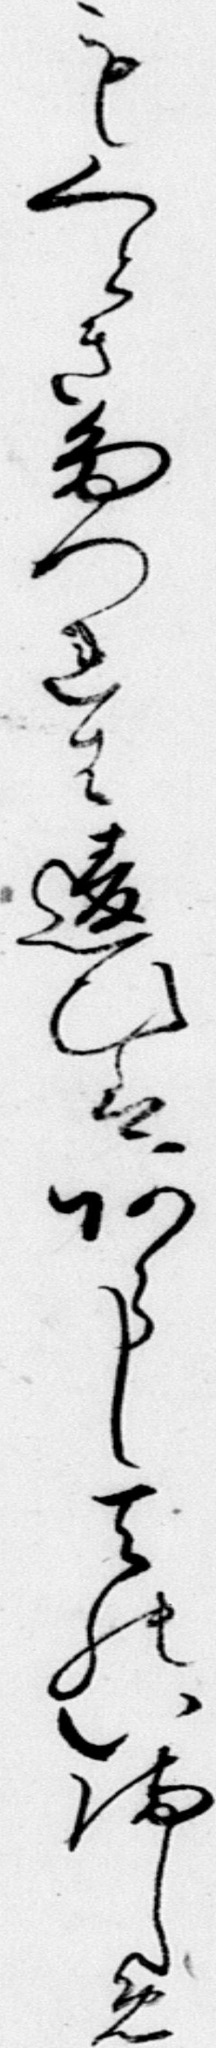もくときたつれは違ひはあらし天のいましめ
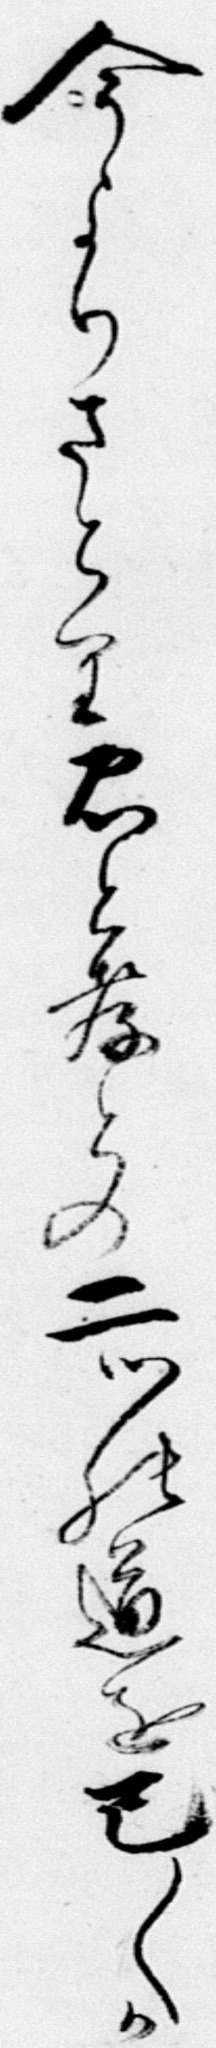今よりさとり忠と孝との二ツの道を己々か
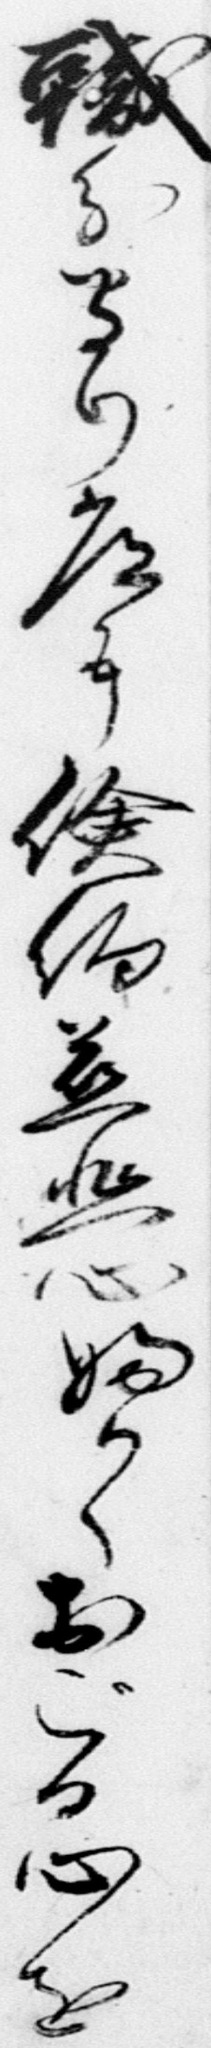職分守り常に倹約慈悲心ふかくおごる心を
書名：越後地震由来
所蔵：徳島県立図書館
